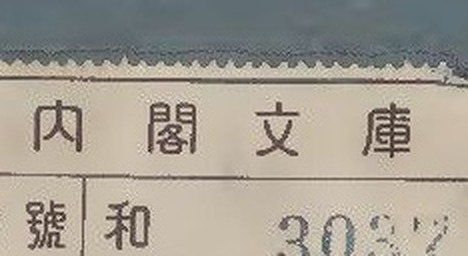内閣文庫
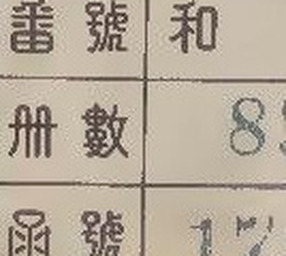冊数()
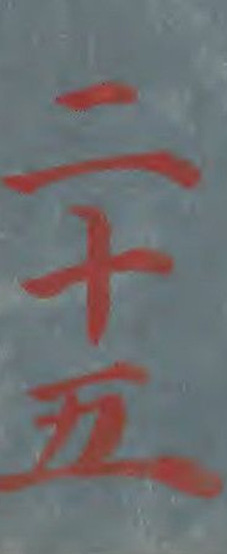二十五

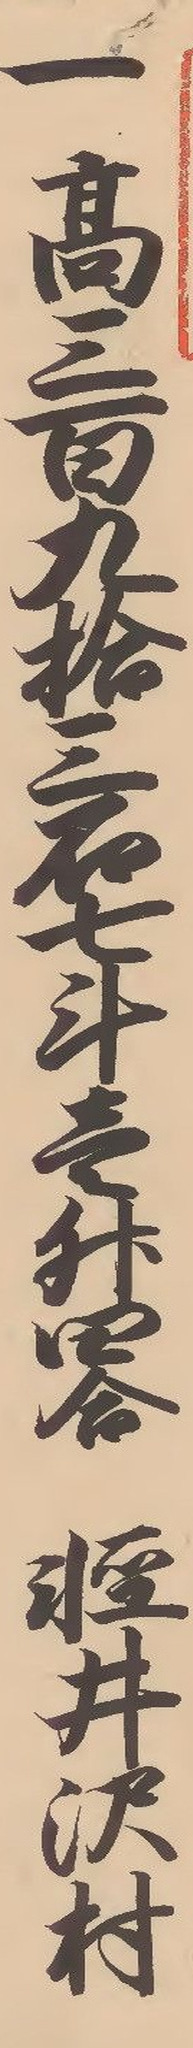一高三百九拾三石七斗壱升四合軽井沢村
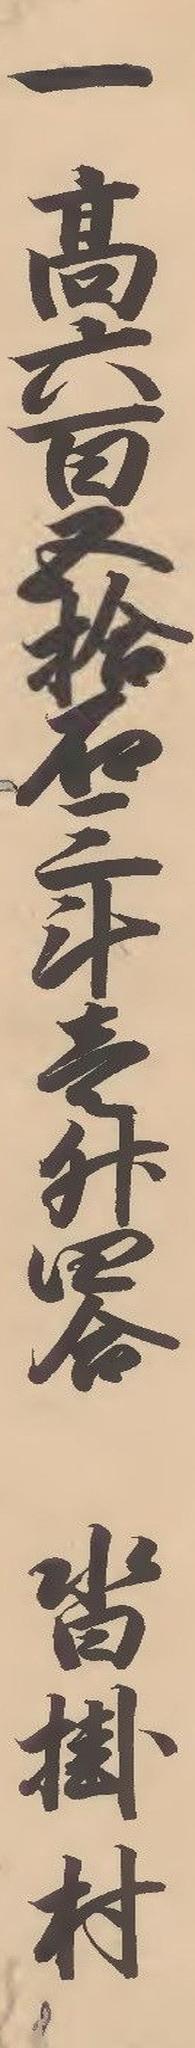一高六百五拾石三斗壱升四合沓掛村

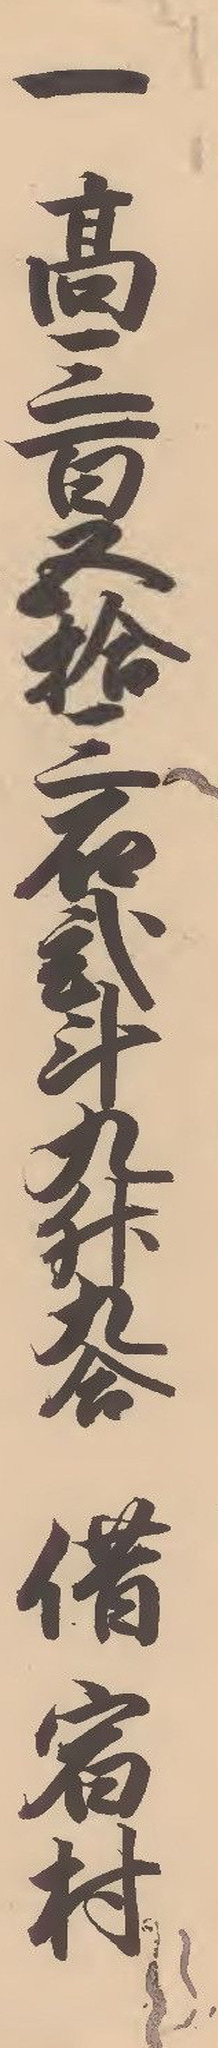一高三百五拾三石弐斗九升九合借宿村
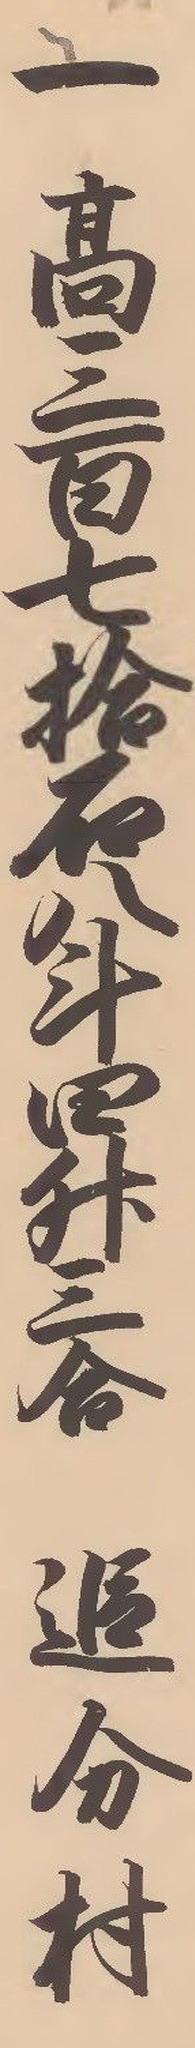一高三百七拾石八斗四升三合追分村
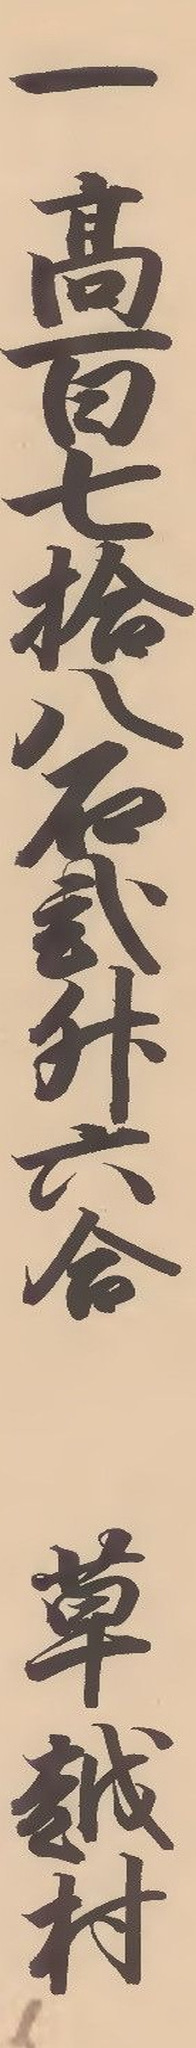一高百七拾八石弐升六合草越村
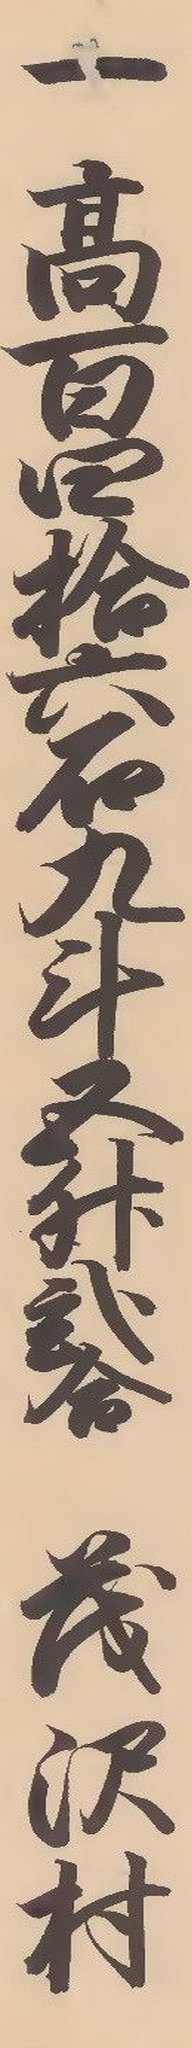一高百四拾六石九斗五升弐合茂沢村
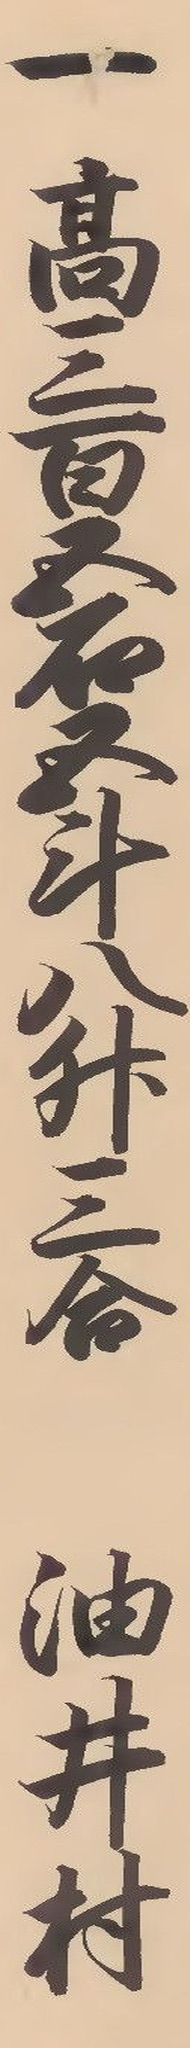一高三百五石五斗八升三合油井村
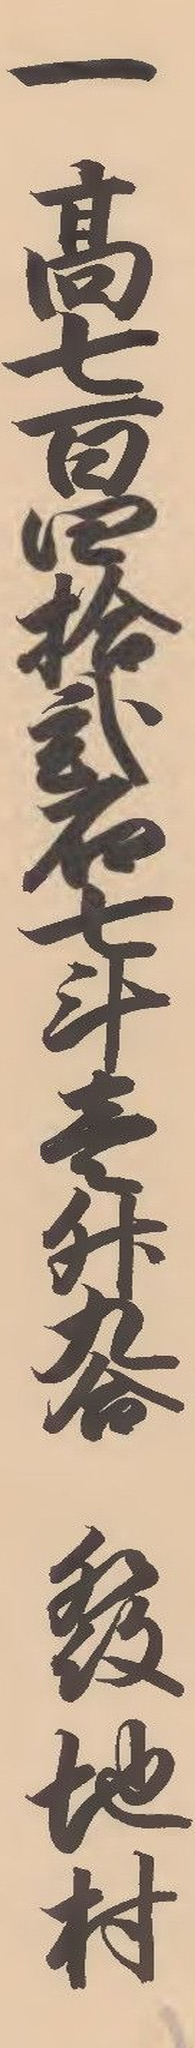一高七百四拾弐石七斗壱升九合発地村
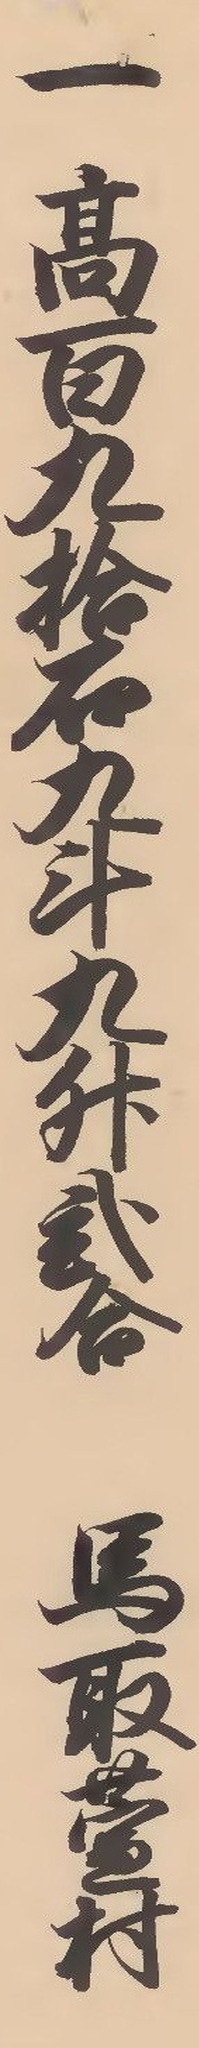一高百九拾石九斗九升弐合馬取萱村
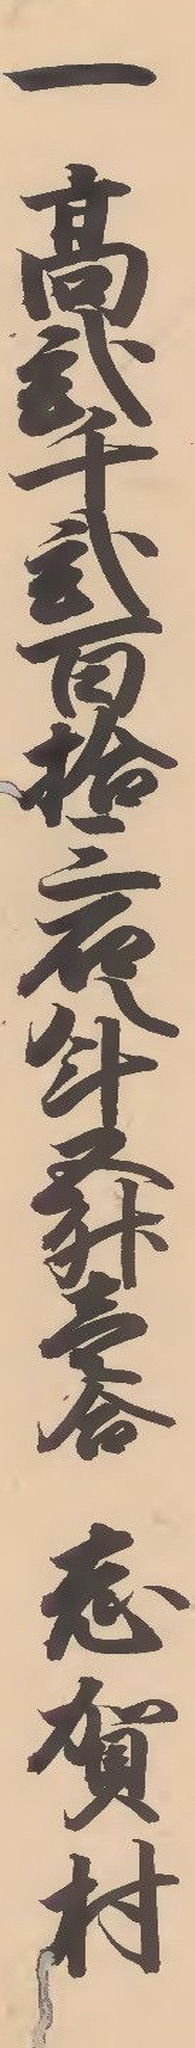一高弐千弐百拾三石八斗五升壱合志賀村

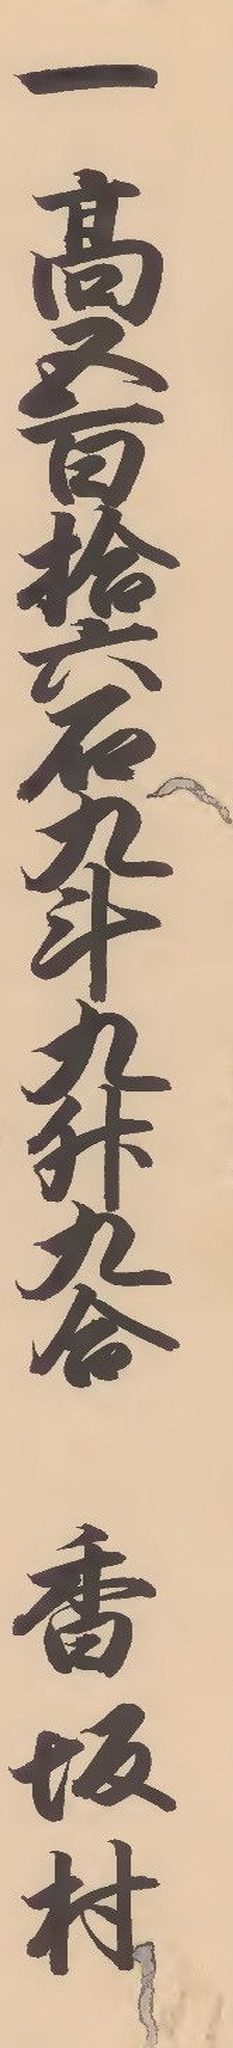一高五百拾六石九斗九升九合香坂村
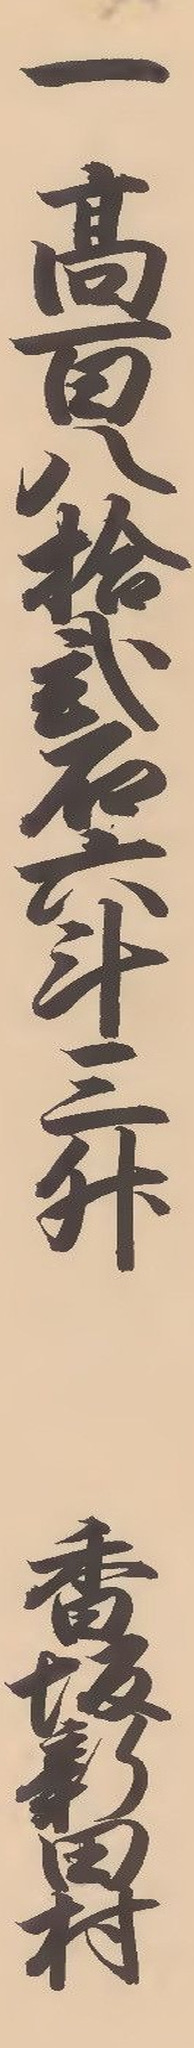一高百八拾弐石六斗三升香坂新田村
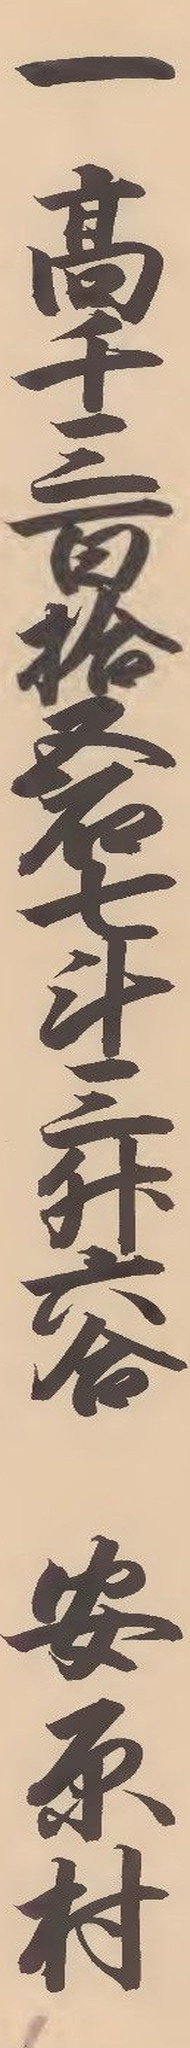一高千三百拾五石七斗三升六合安原村
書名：信濃国郷帳
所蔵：国立公文書館 National Archives of Japan
